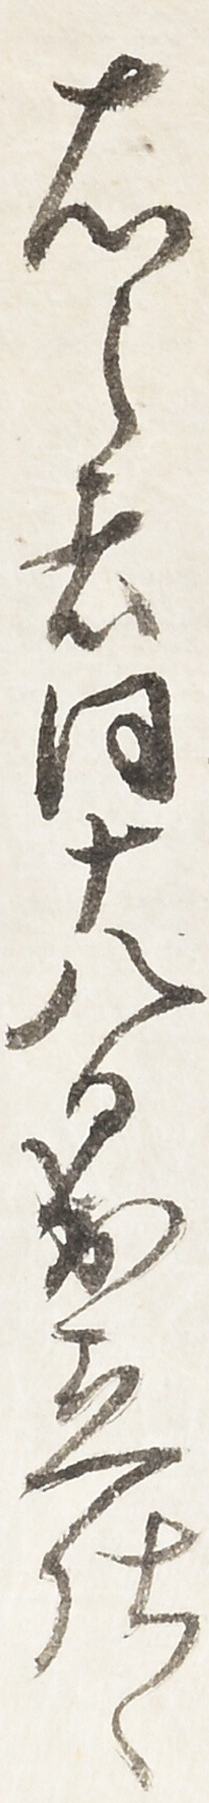右之者同十三日出立仕候
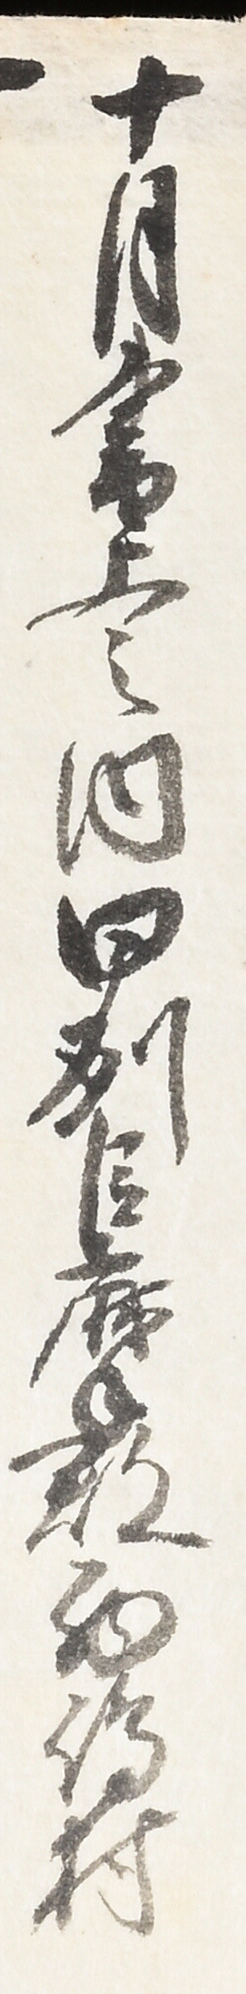十月書上之内甲州巨摩郡西嶋村
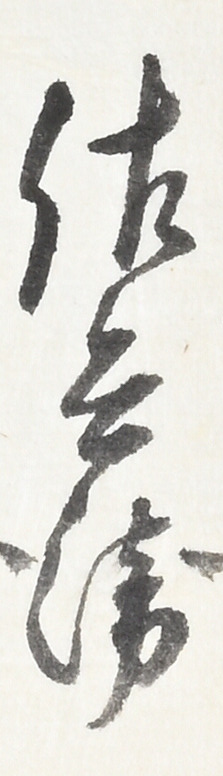佐兵衛
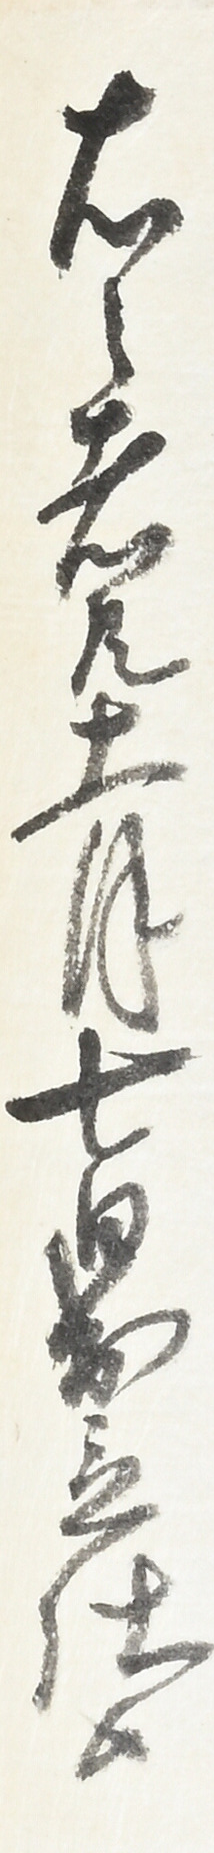右之者共十一月七日出立仕候
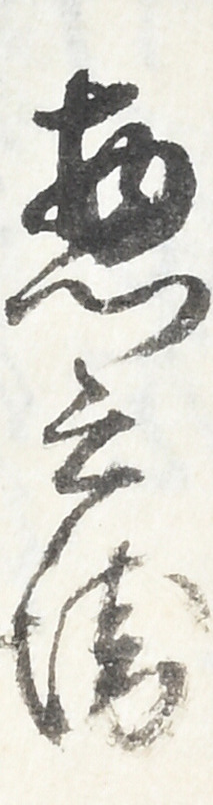佐兵衛

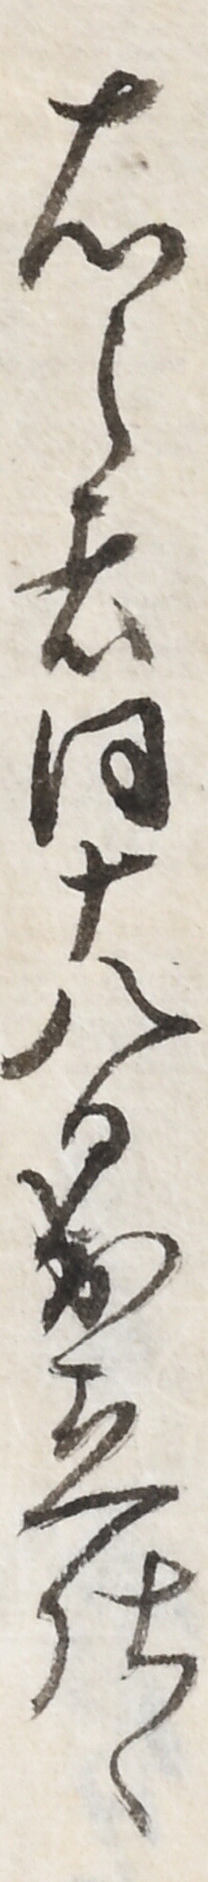右之者同十五日出立仕候
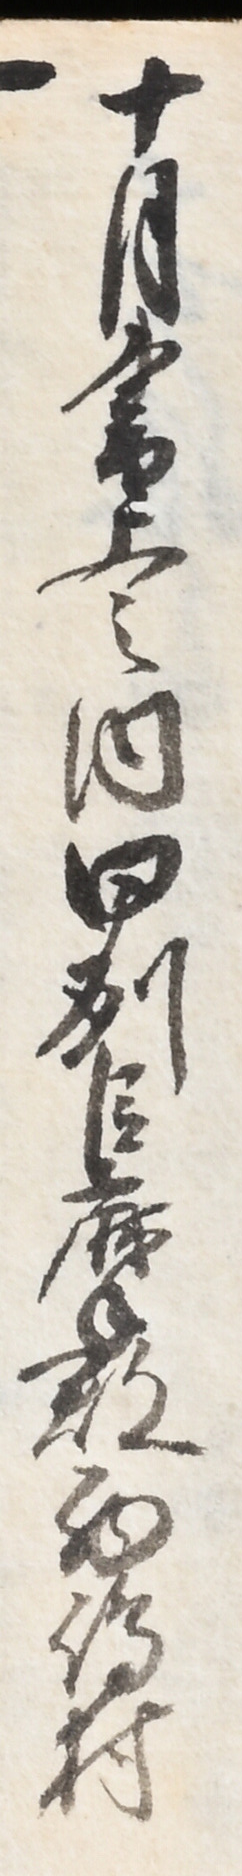十月書上之内甲州八ツ代郡岩間村
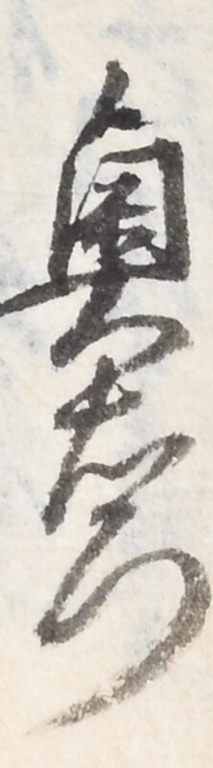文右衛門
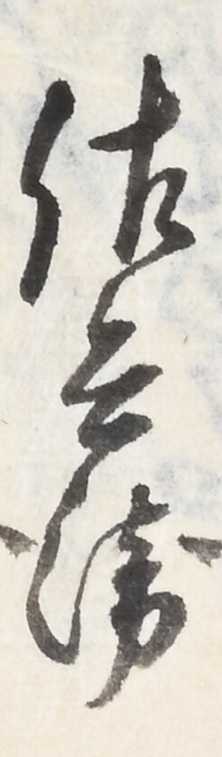惣兵衛
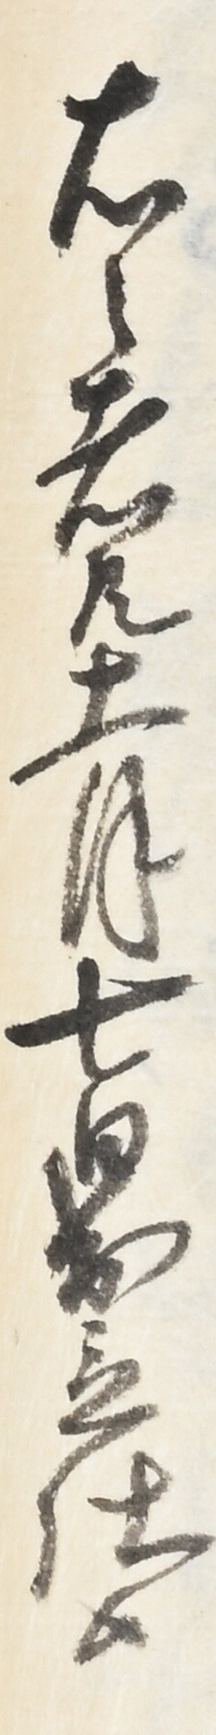右之者十一月十日出立仕候
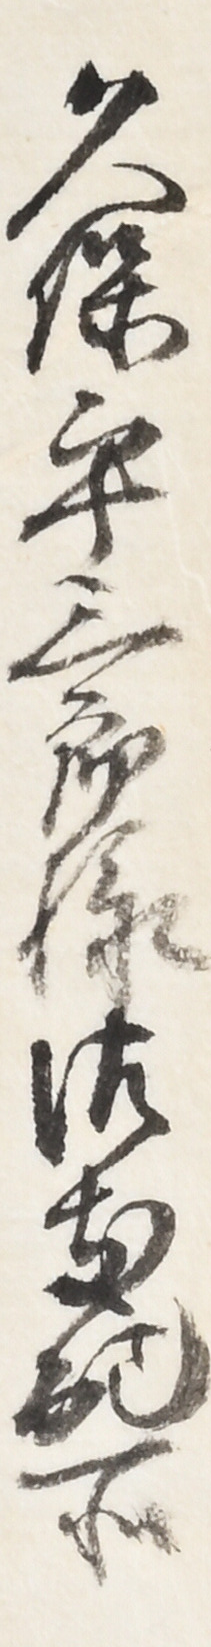久保平三郎様御支配所
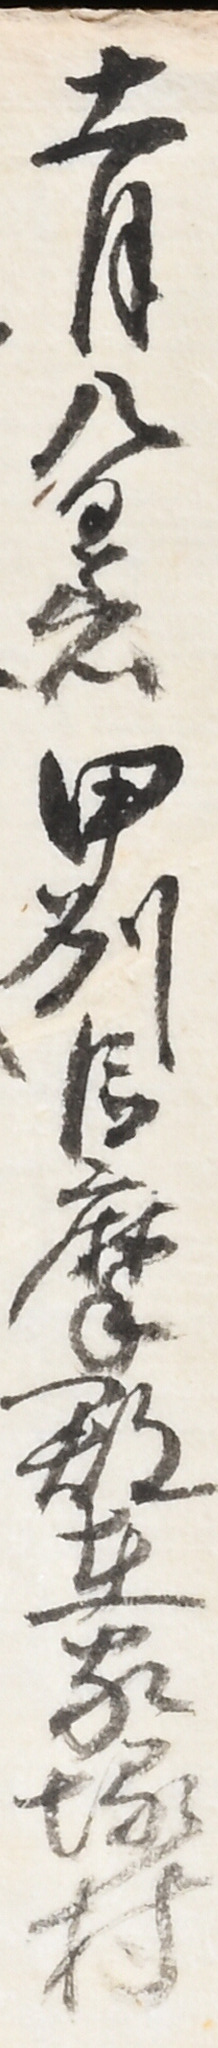十一月八日着甲州巨摩郡在家塚村
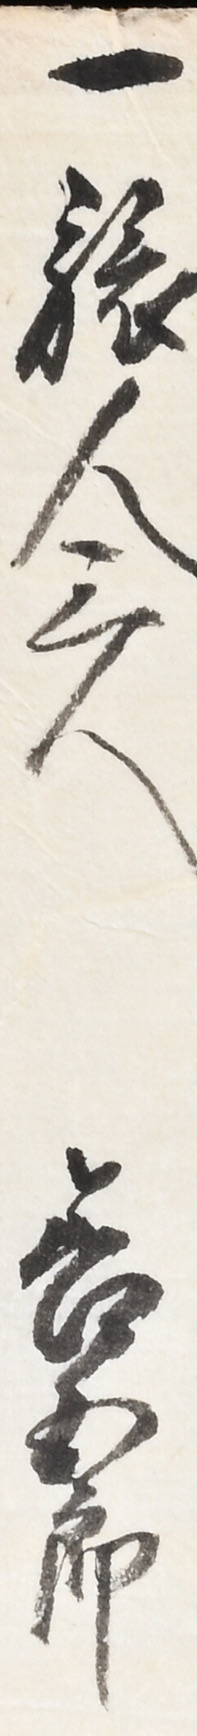一旅人三人善五郎
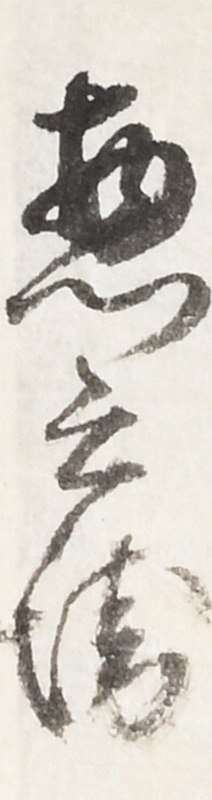惣兵衛
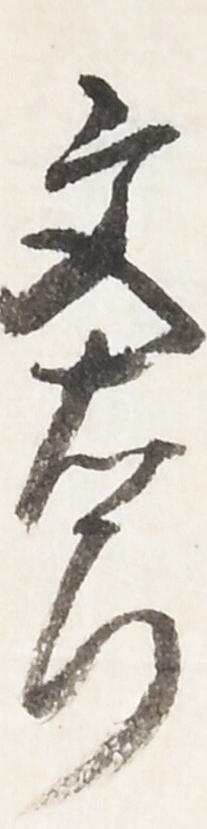文右衛門
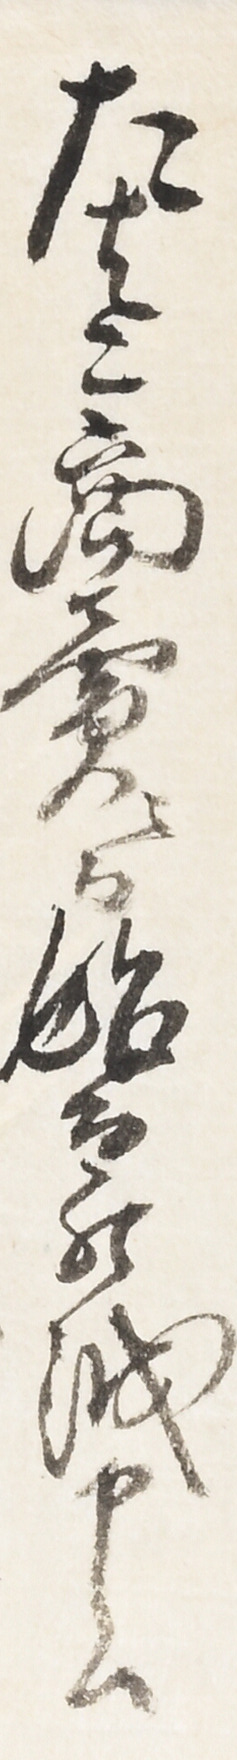たはこ商売ニ而始而罷越申候
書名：旅人泊控帳
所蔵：伊那市立高遠町図書館・合同会社AMANE
